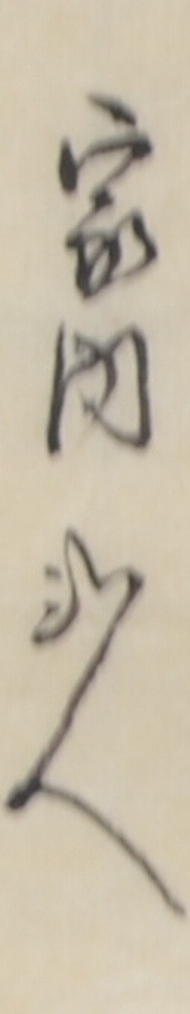家内弐人
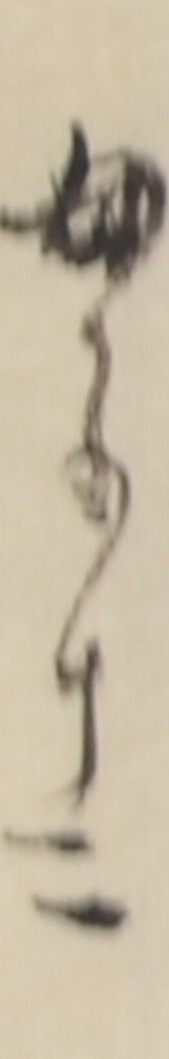母子十二
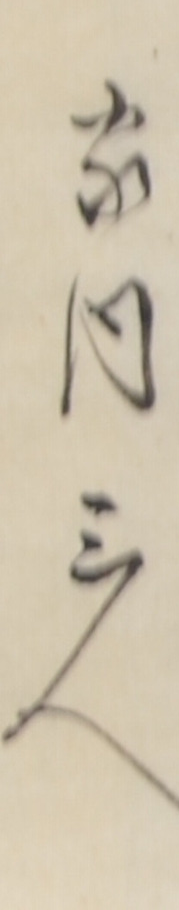家内弐人
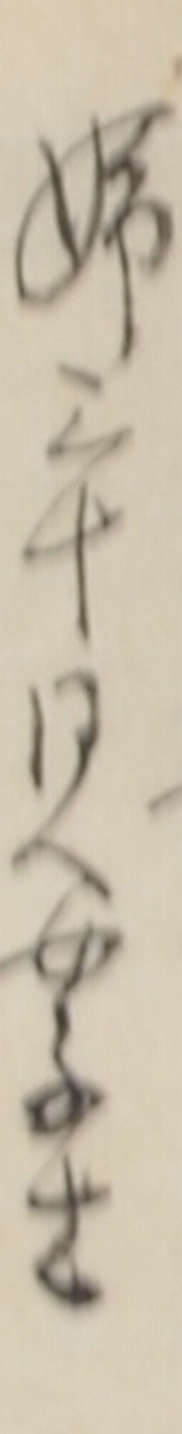婦三十同人女子
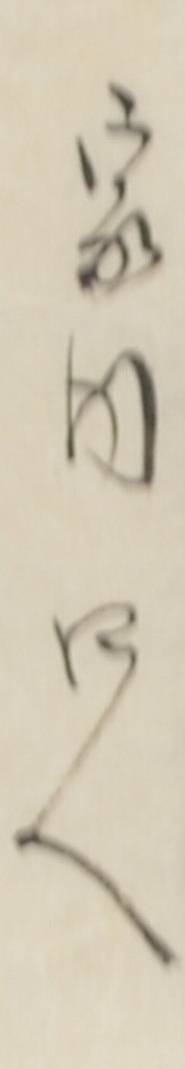家内弐人
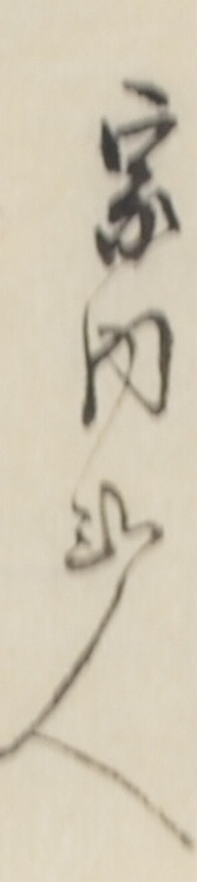家内弐人
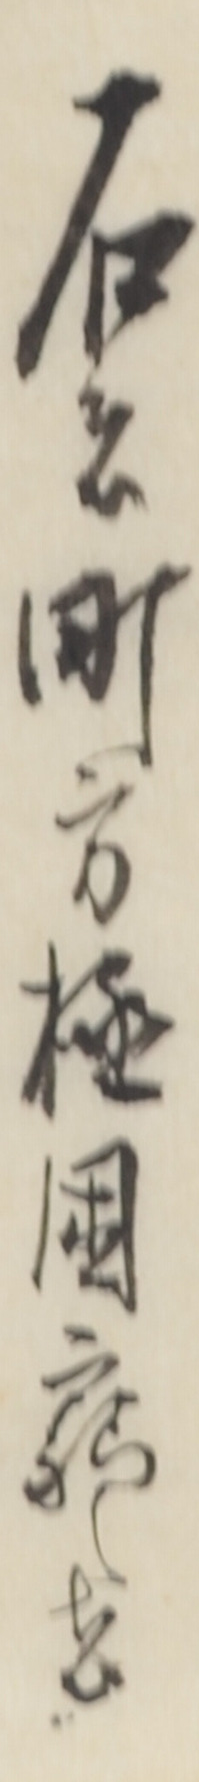右は町方極困窮之者
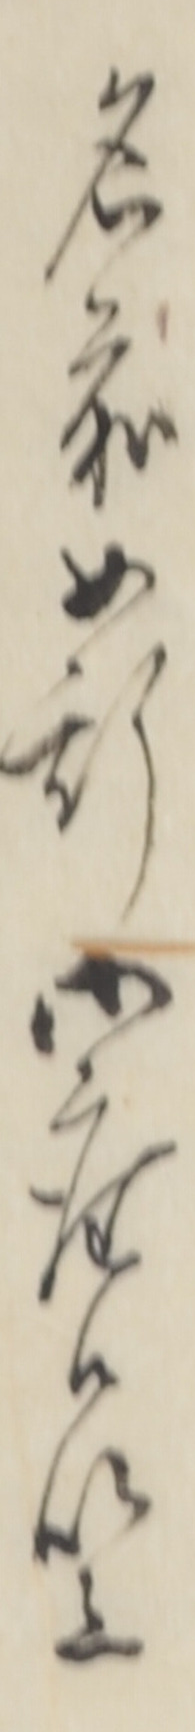名前如斯御座候以上
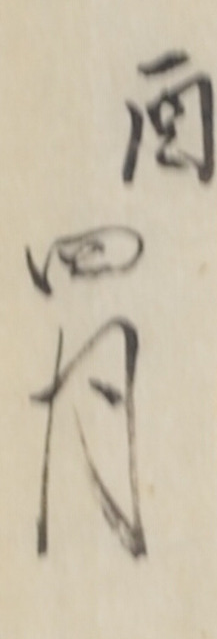酉四月
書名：（町方極困窮者名前書上）
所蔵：伊那市立高遠町図書館・合同会社AMANE
